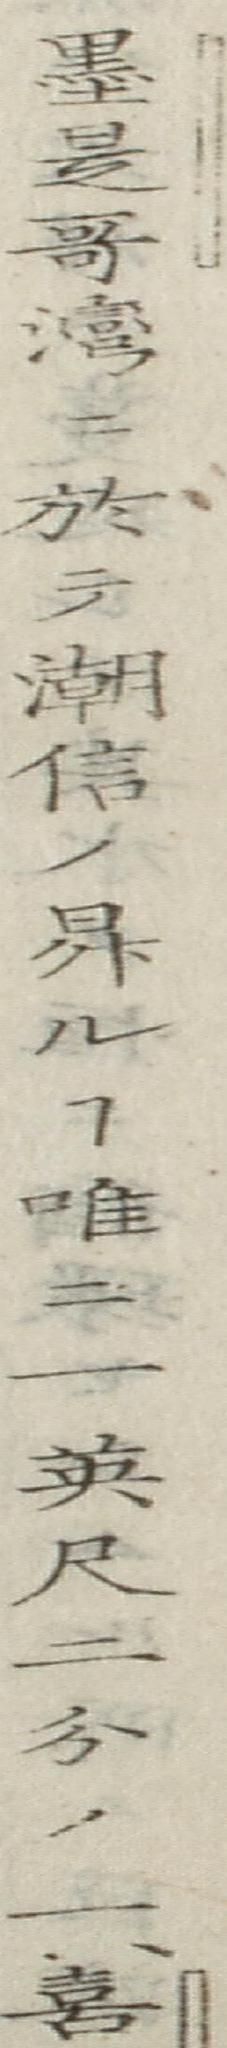墨是哥湾ニ於テ潮信ノ昇ルヿ唯ニ一英尺二分ノ一、喜
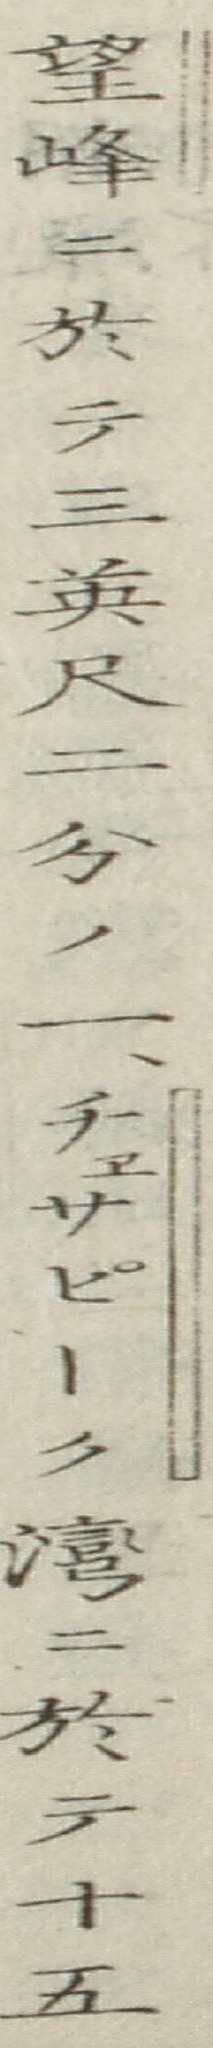望峰ニ於テ三英尺二分ノ一、チェサピーク湾ニ於テ十五
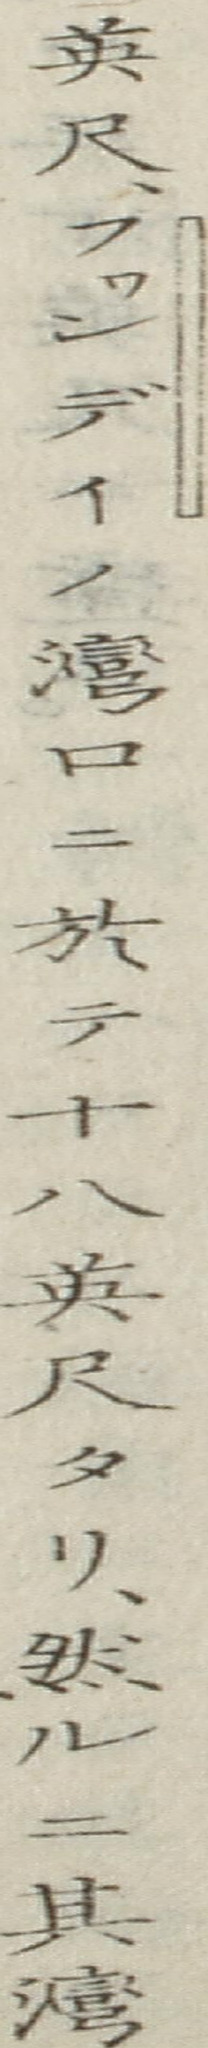英尺、フヮンデイノ湾口ニ於テ十八英尺タリ、然ルニ其湾
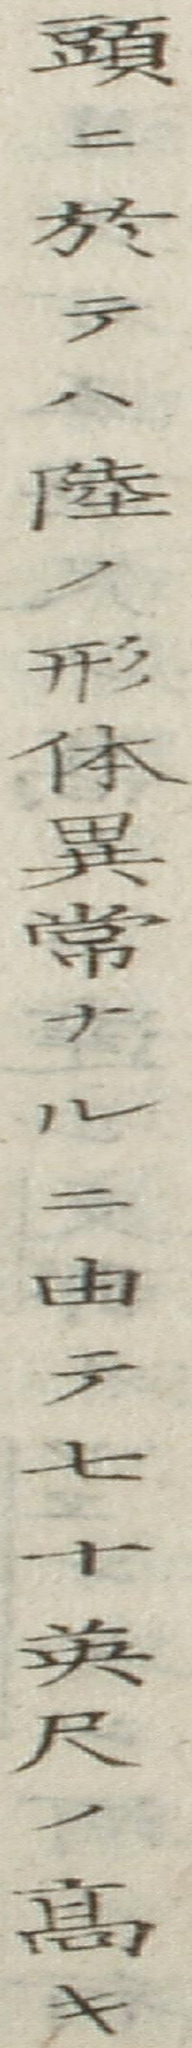頭ニ於テハ陸ノ形体異常ナルニ由テ七十英尺ノ高キ
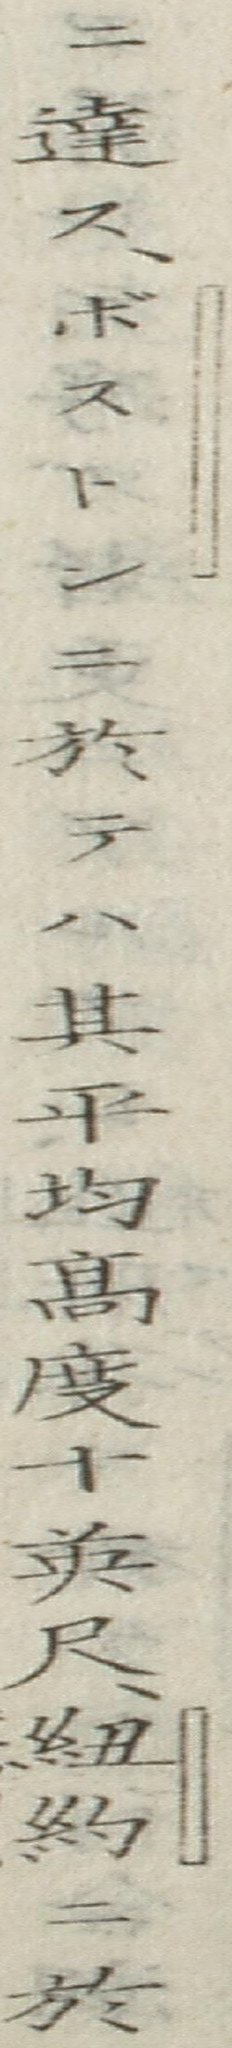ニ達ス、ボストンニ於テハ其平均高度十英尺、紐約ニ於
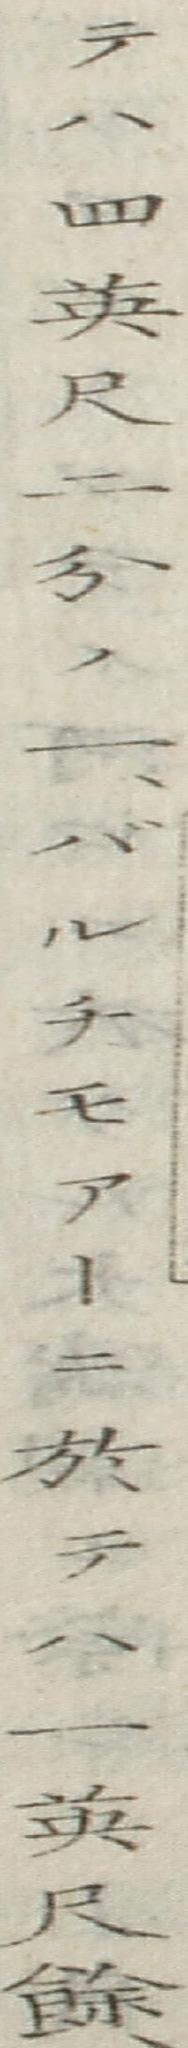テハ四英尺二分ノ一、バルチモアーニ於テハ一英尺余、
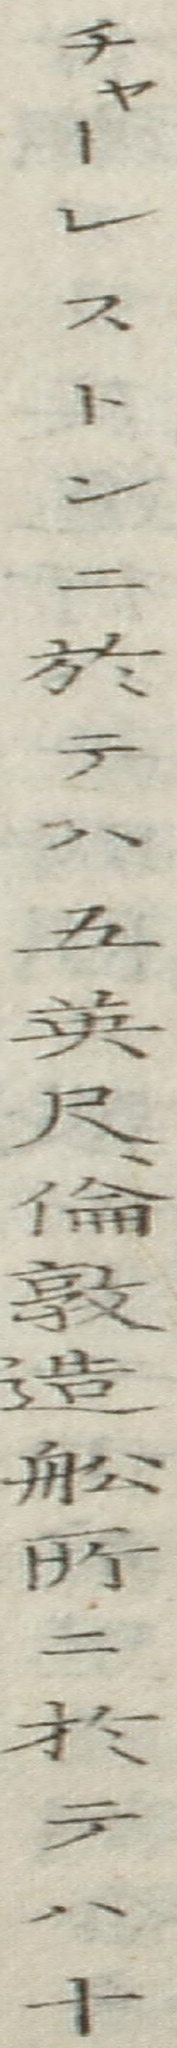チャーレストンニ於テハ五英尺、倫敦造船所ニ於テハ十
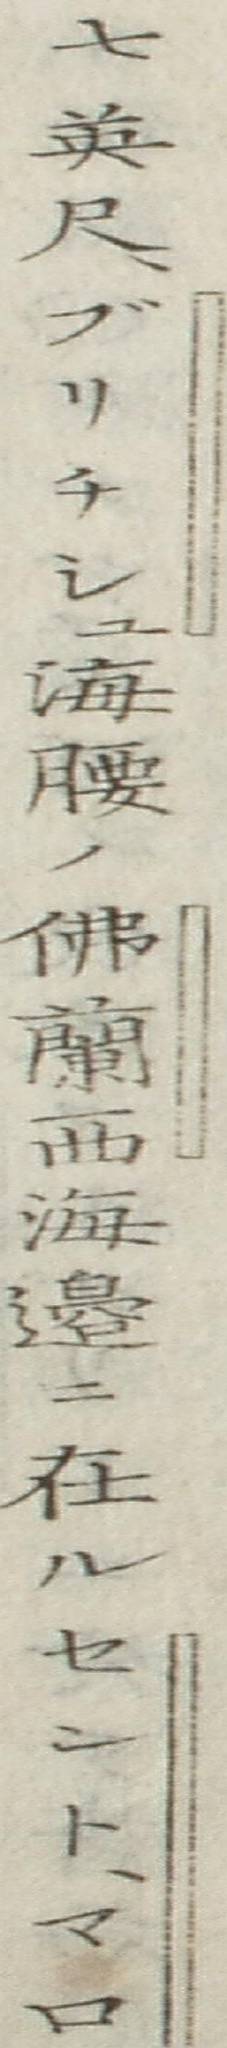七英尺、ブリチシュ海腰ノ仏蘭西海辺ニ在ルセント、マロ
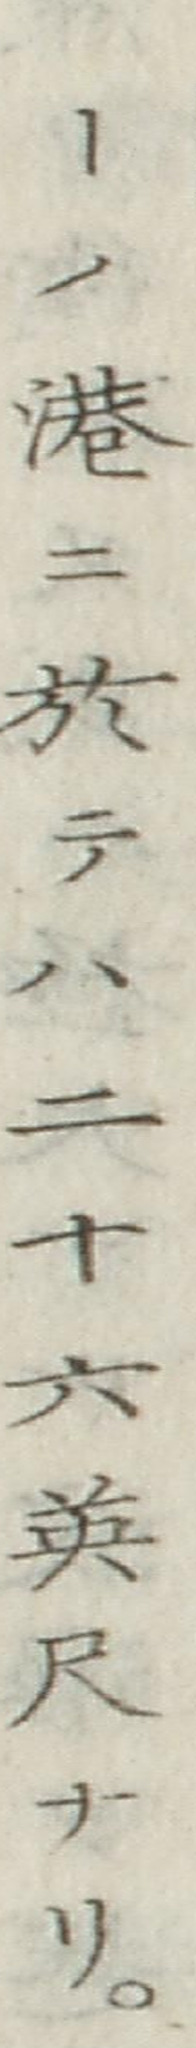ーノ港ニ於テハ二十六英尺ナリ。
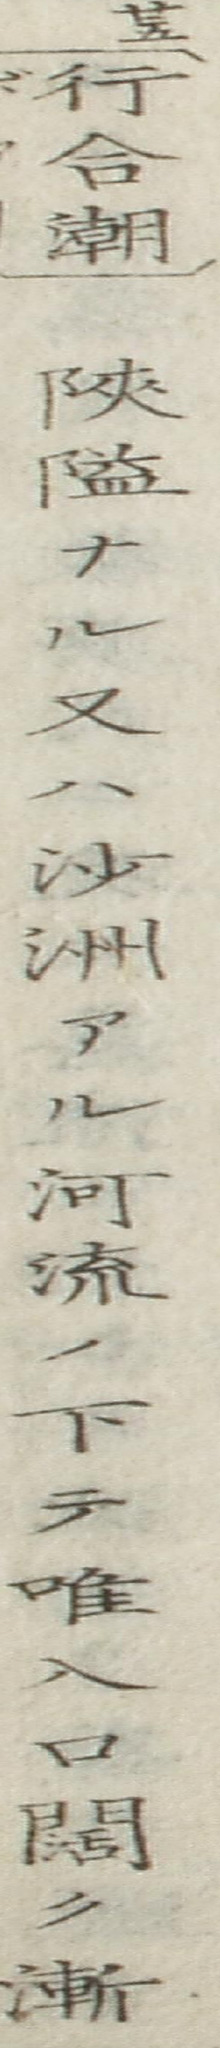廿五〔行合潮〕狭隘ナル又ハ沙洲アル河流ノ下テ唯入口闊ク漸
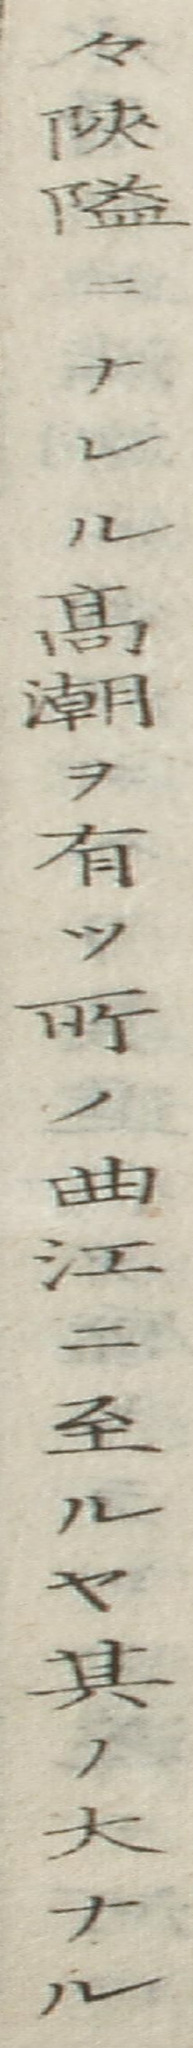々狭隘ニナレル高潮ヲ有ツ所ノ曲江ニ至ルヤ其ノ大ナル

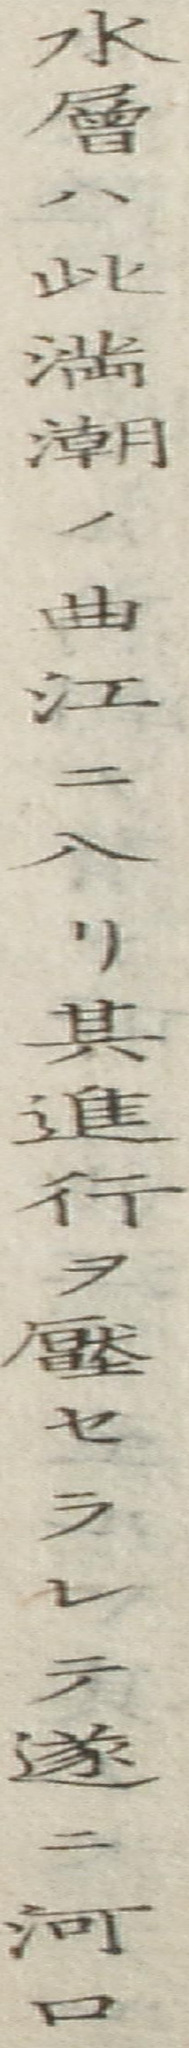水層ハ此満潮ノ曲江ニ入リ其進行ヲ圧セラレテ遂ニ河口
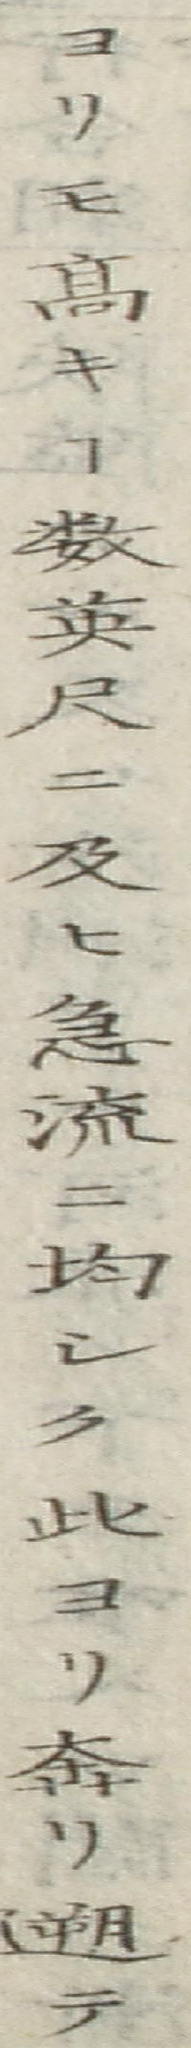ヨリモ高キヿ数英尺ニ及ヒ急流ニ均シク此ヨリ奔リ遡テ
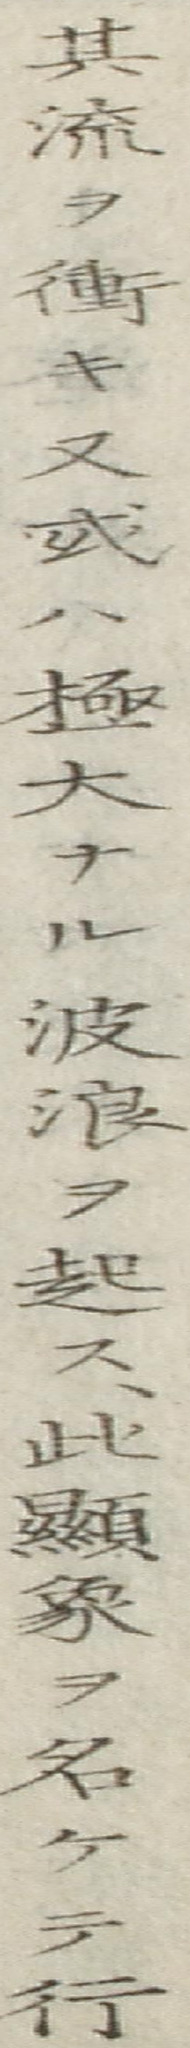其流ヲ衝キ又或ハ極大ナル波浪ヲ起ス、此顕象ヲ名ケテ行
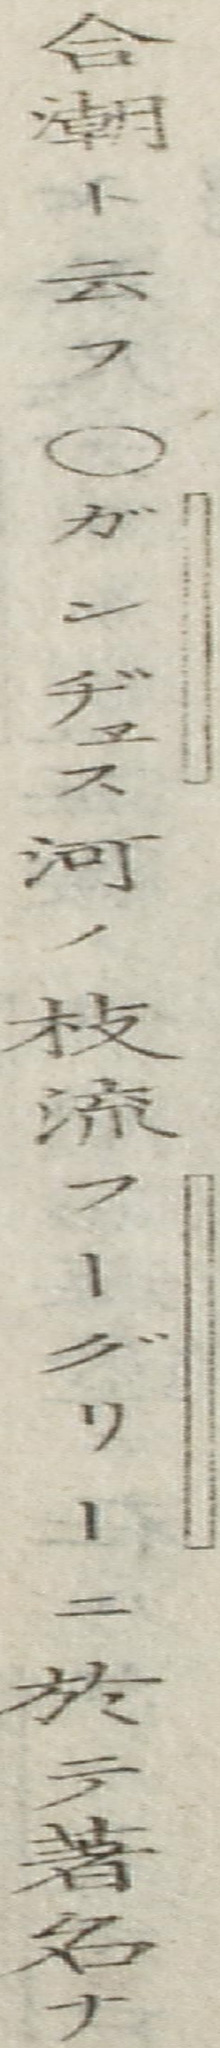合潮ト云フ○ガンヂェス河ノ枝流フーグリーニ於テ著名ナ
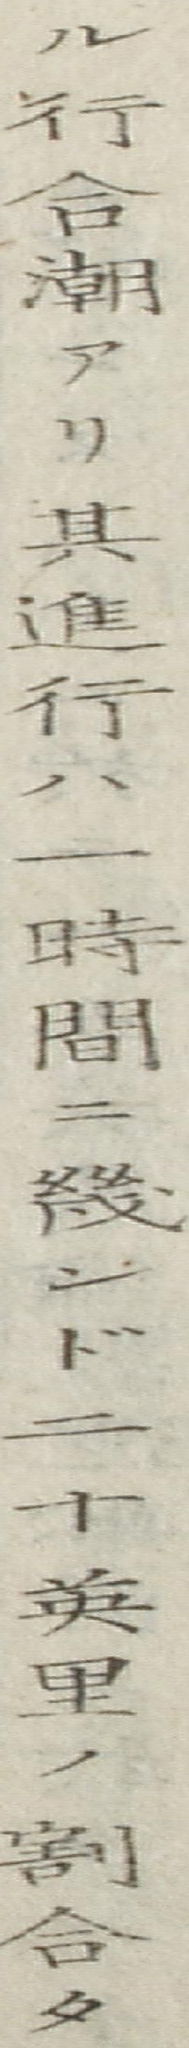ル行合潮アリ其進行ハ一時間ニ幾ンド二十英里ノ割合タ
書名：地形論　巻二
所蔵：東京大学地震研究所図書室 Earthquake Research Institute Library, The University of Tokyo, JAPAN
